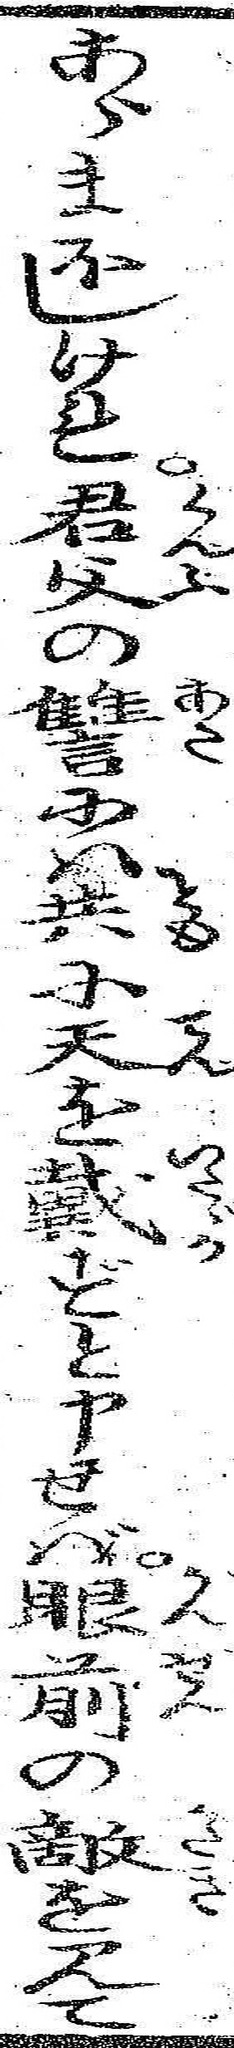あらまほしけれ。君父の讐には共に天を戴ずと申せば。眼前の敵を見て
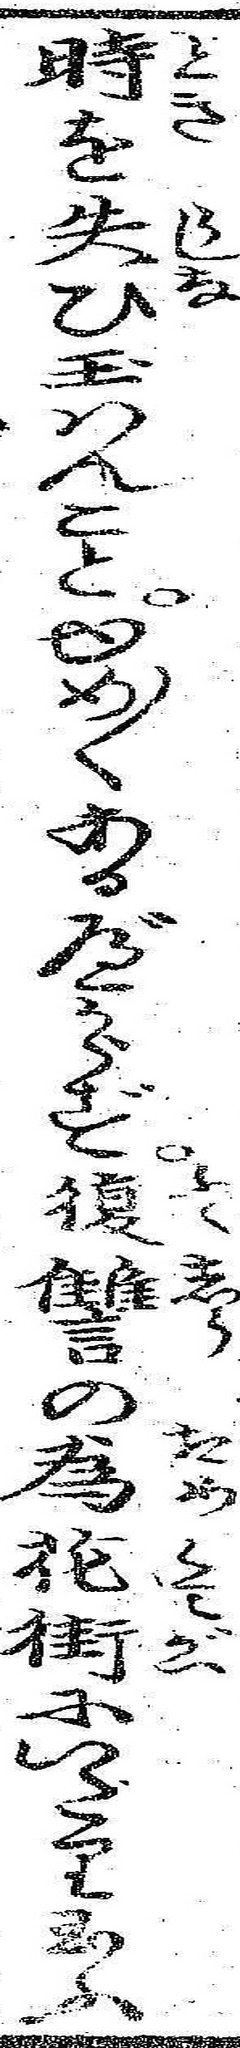時を失ひ玉はんこと。ゆめ〳〵あるべからず。復讐の為花街にいたり玉ふ
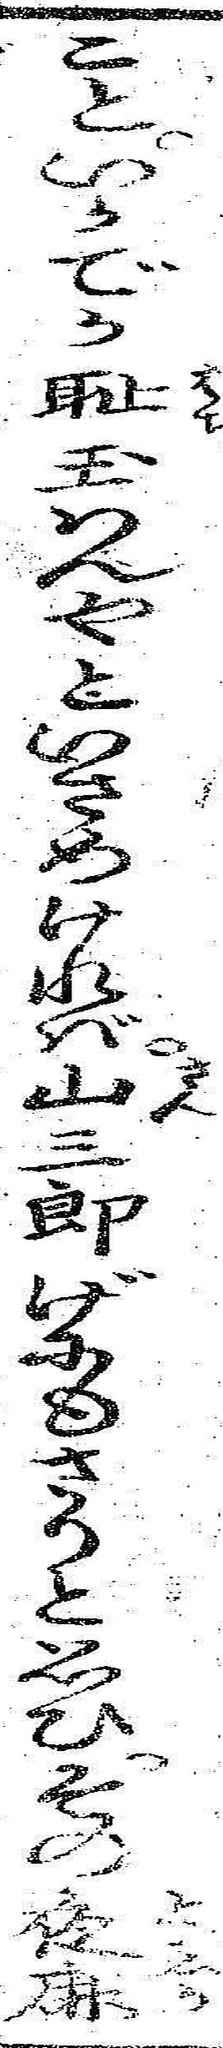こと。いかでか恥玉はんやといさめければ。山三郎げにもさりと思ひ。その夜鹿
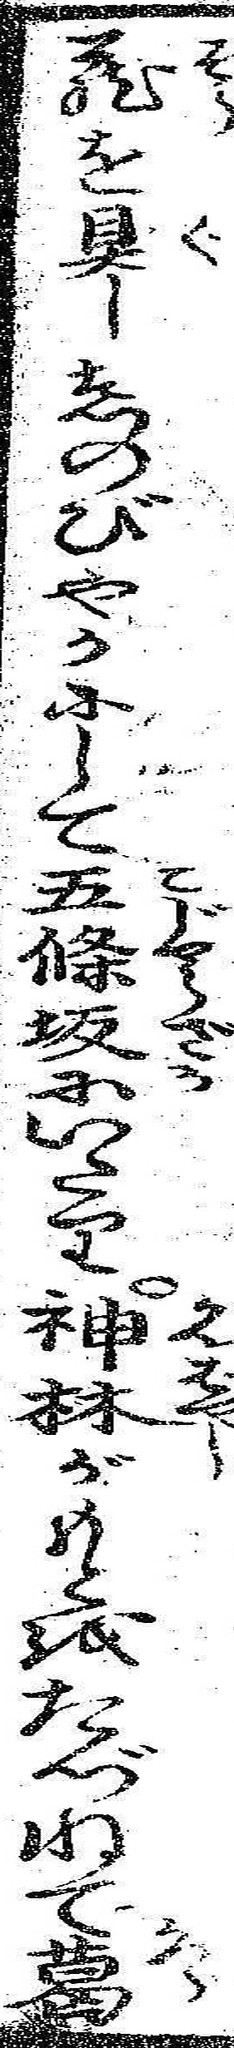蔵を具ししのびやかにして五条坂にいたり。神林がもとをたづねて葛
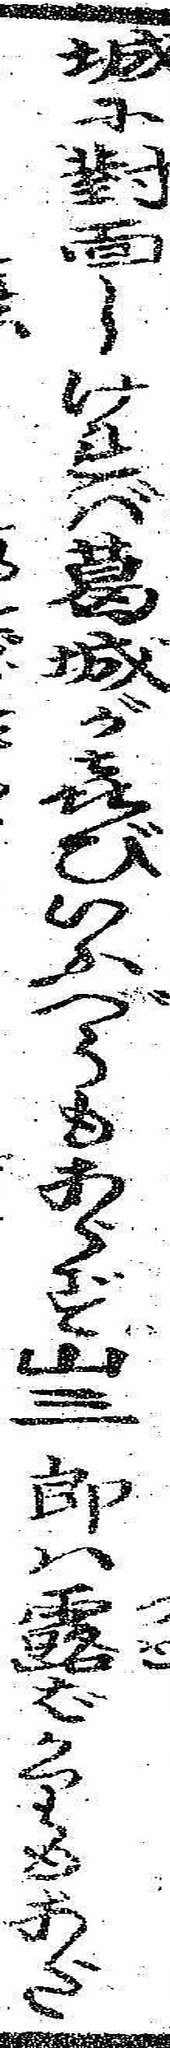城に対面しければ。葛城が㐂びいふべうもあらず。山三郎は露ばかりもあだ
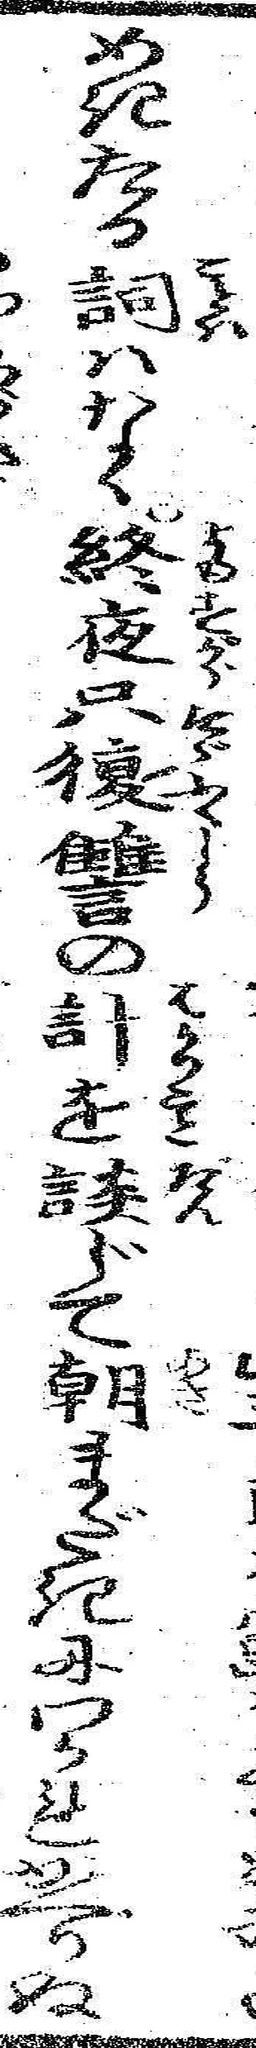めきたる詞はなく。終夜只復讐の計を談じて朝まだきにわかりれかへりぬ
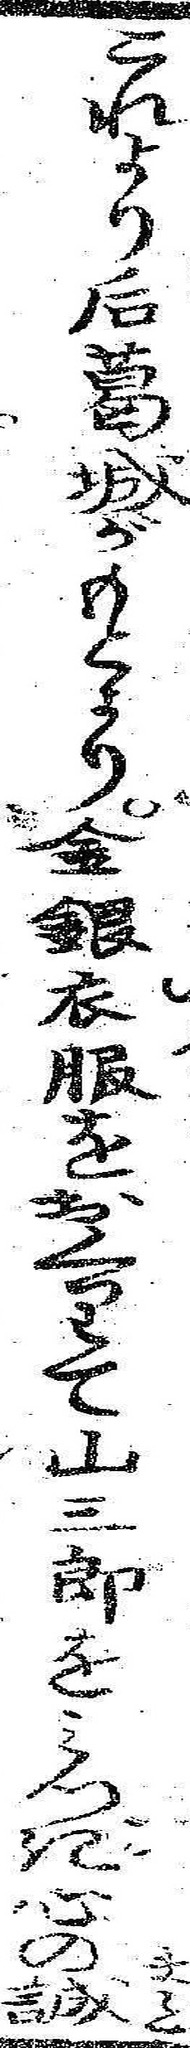これより后葛城がもとより。金銀衣服をおくりて山三郎をみつぎ心の誠
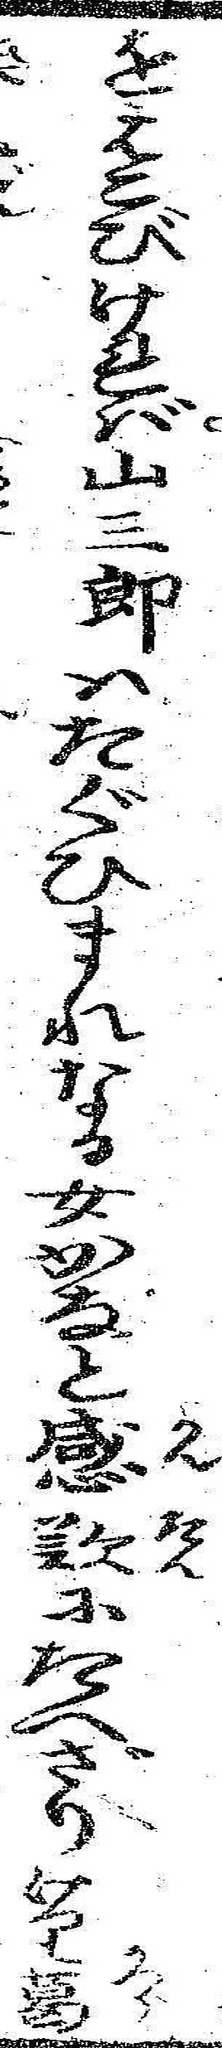をはこびければ。山三郎はたぐひまれなる女かなと感歎にたへざりけり葛
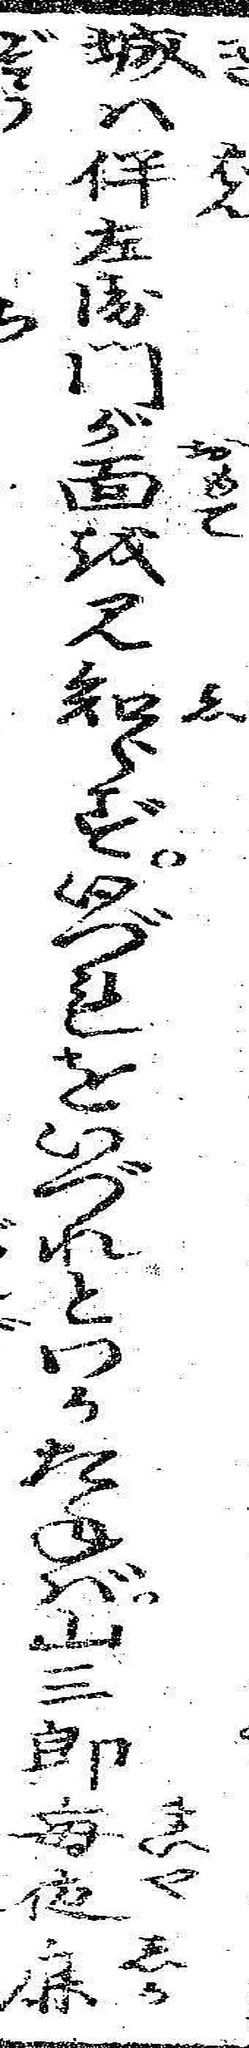城は伴左衛門が面を見知らず。いづれをいづれとわかたねば。山三郎毎夜鹿
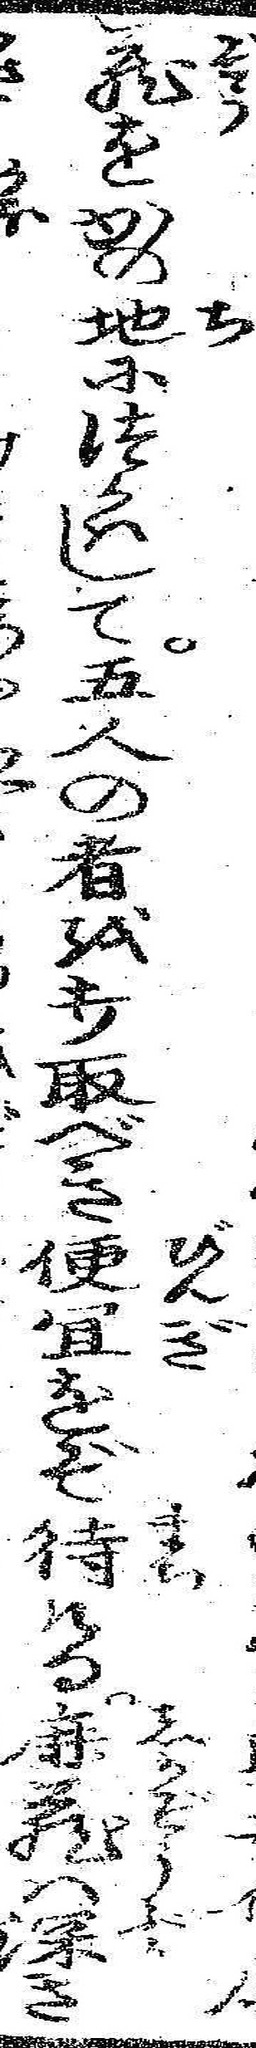蔵をかの地につかはして。五人の者を打取べき便宜をぞ待ける。鹿蔵は深き
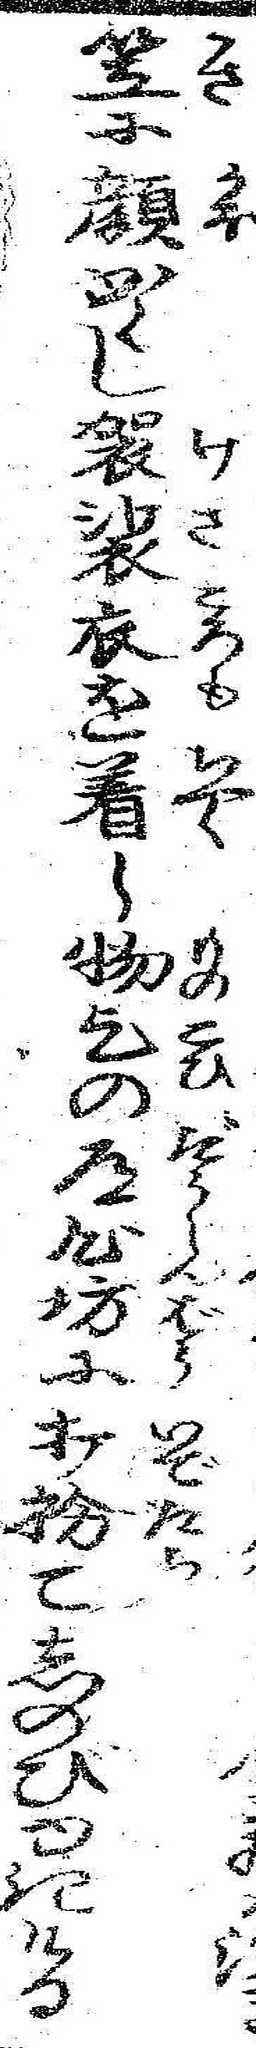笠に顔かくし袈裟衣を着し物乞の道心坊に打扮てしのびゆきける
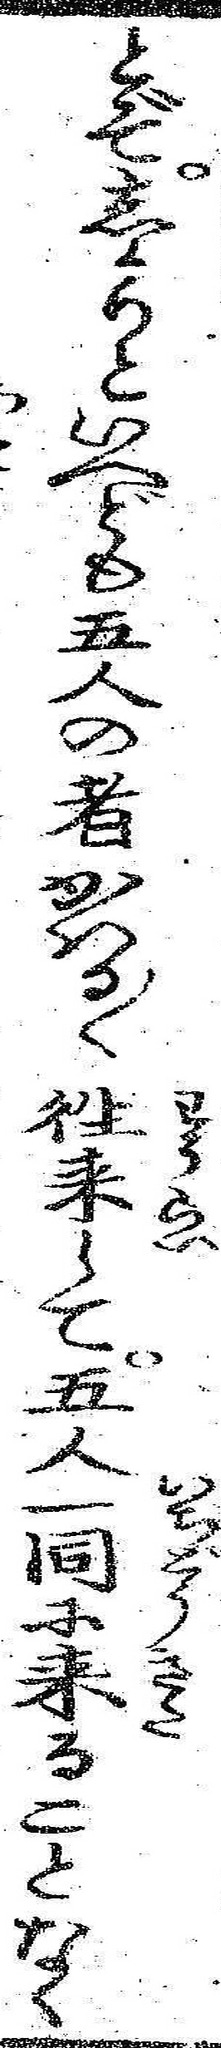とぞ。しかりといへども五人の者かはる〳〵往来して。五人一同に来ることなく
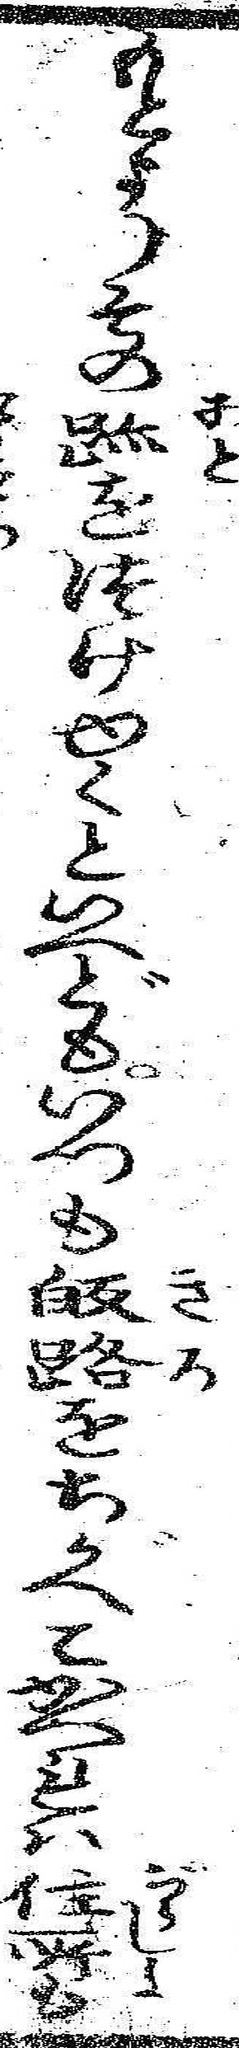もとよりその跡をつけゆくといへども。いつも帰路をちがへてかへれは住所も
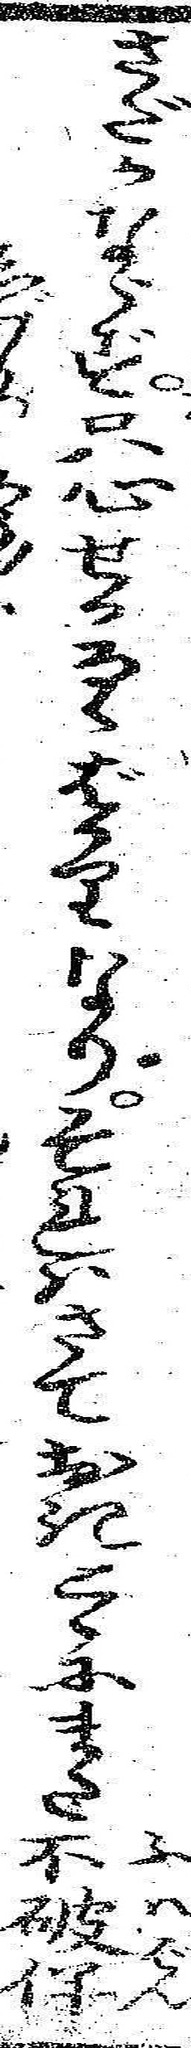さだかならず。只心せかるゝばかりなり。それはさておきこゝにまた不破伴
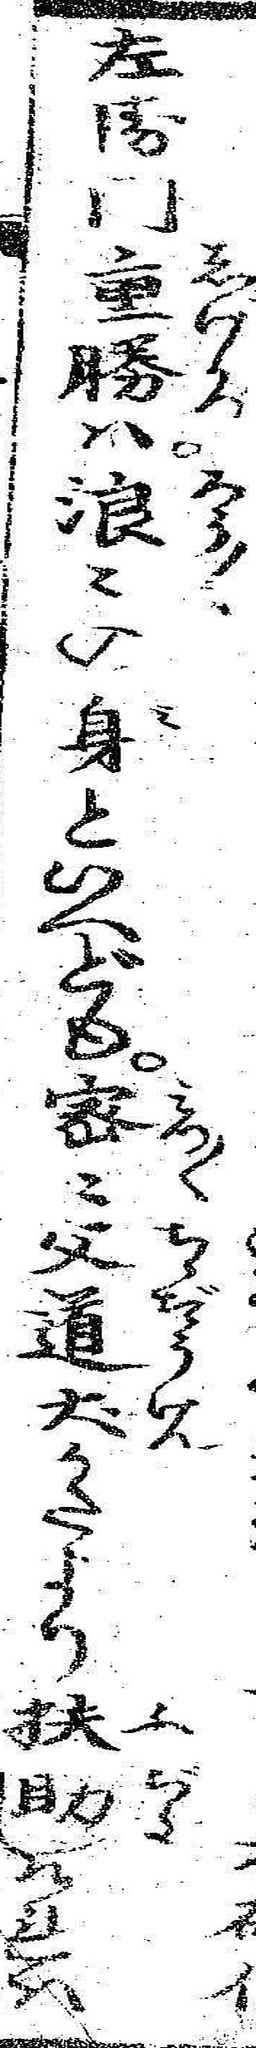左衛門重勝は。浪々の身といへども。密々父道犬かたより扶助しけれはゝ

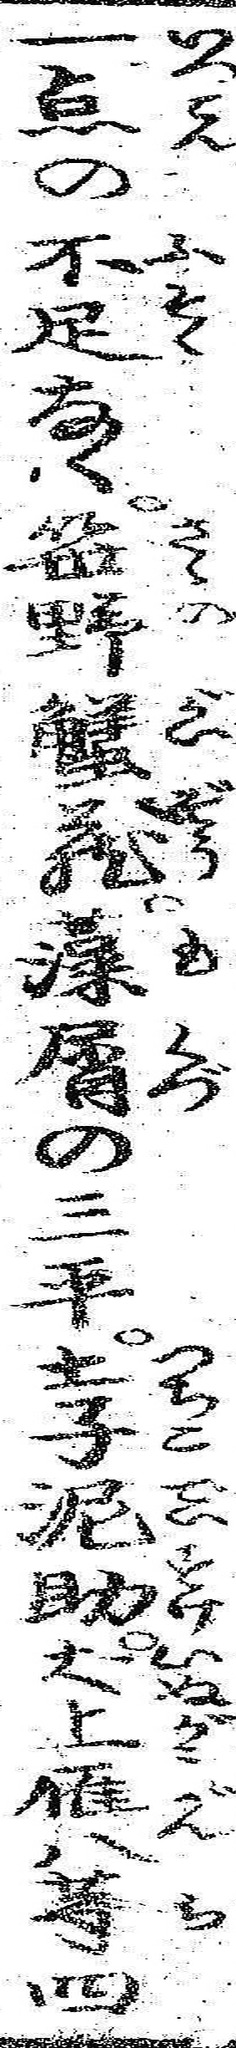一点の不足なく。笹野蟹蔵。藻屑の三平。土子泥助。犬上雁八等四
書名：昔話稲妻表紙
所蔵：国文学研究資料館
